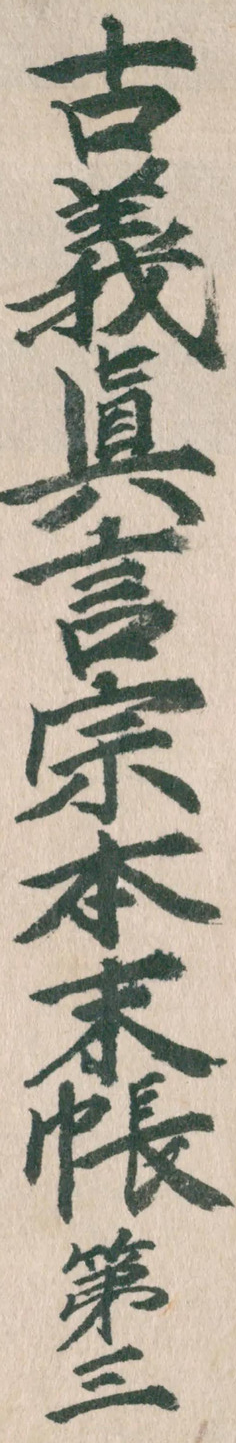古義真言宗本末帳第三

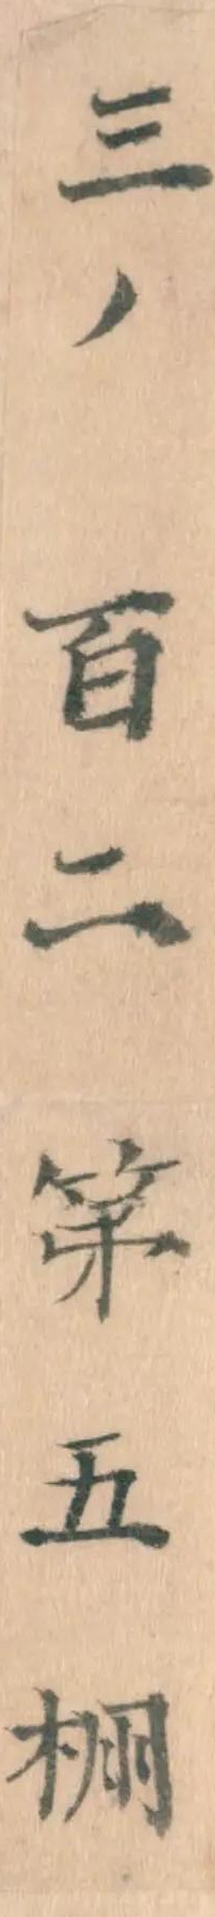三ノ百二第五棚
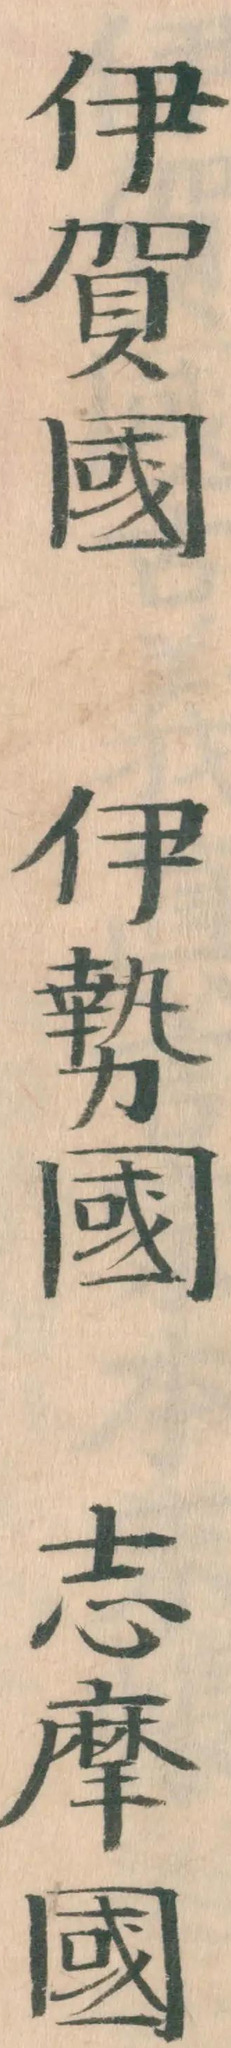伊賀国伊勢国志摩国
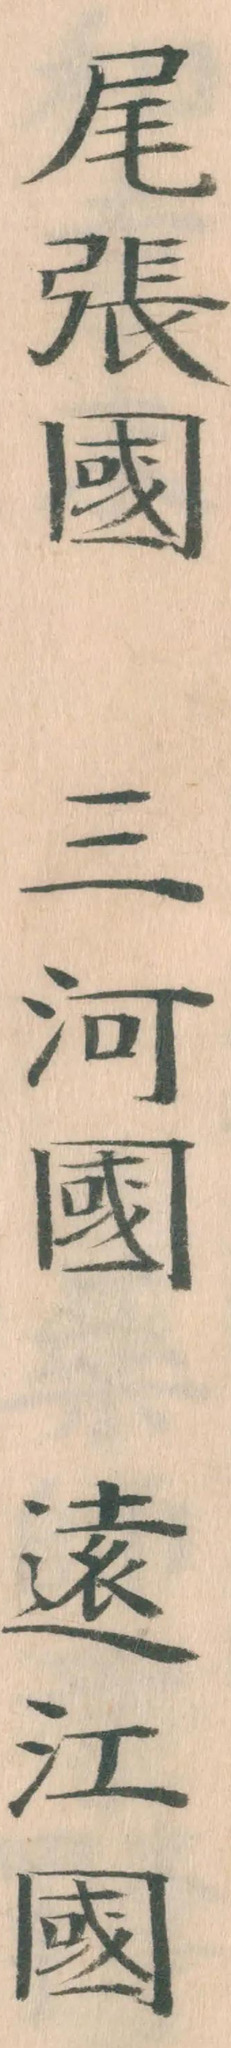尾張国三河国遠江国
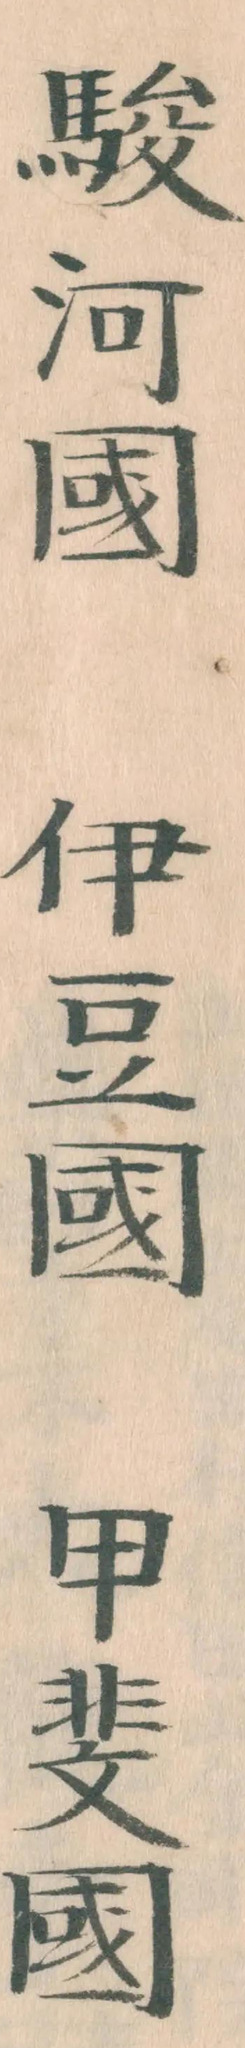駿河国伊豆国甲斐国
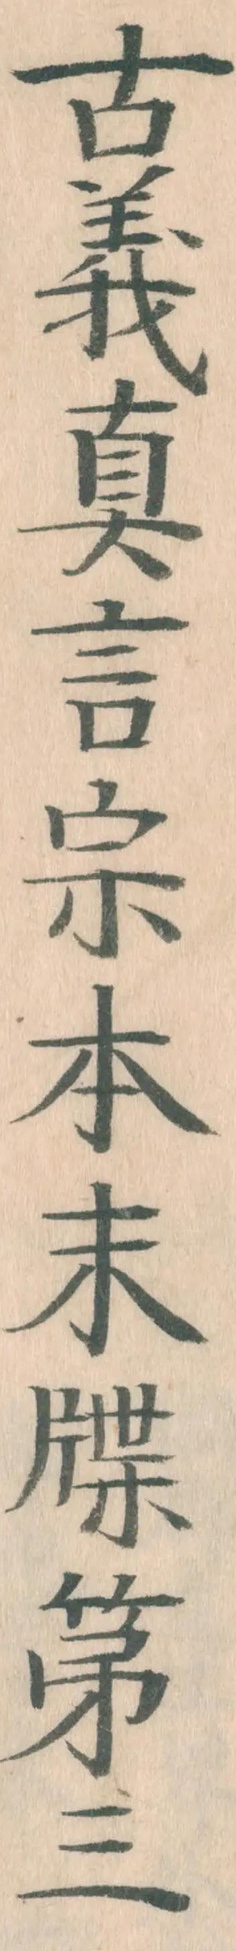古義真言宗本末牒第三

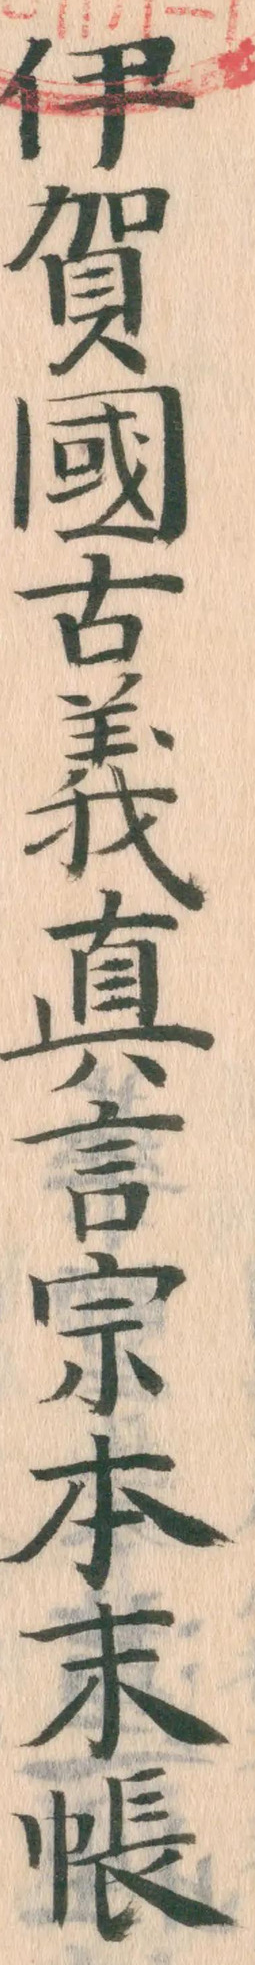伊賀国古義真言宗本末帳
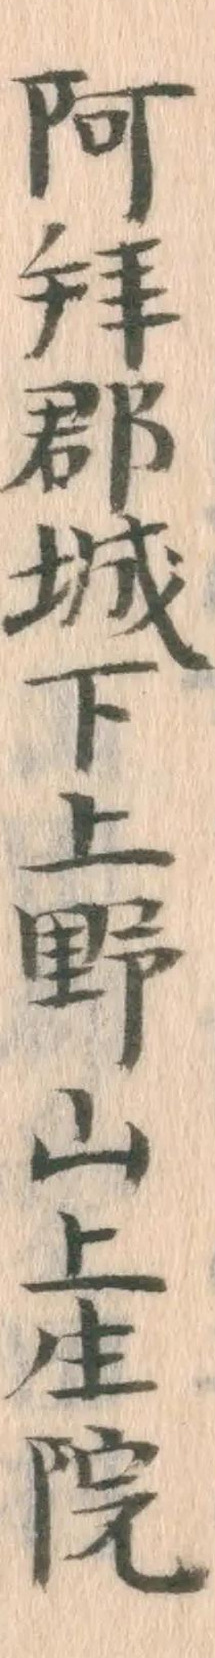阿拝郡城下上野山上生院
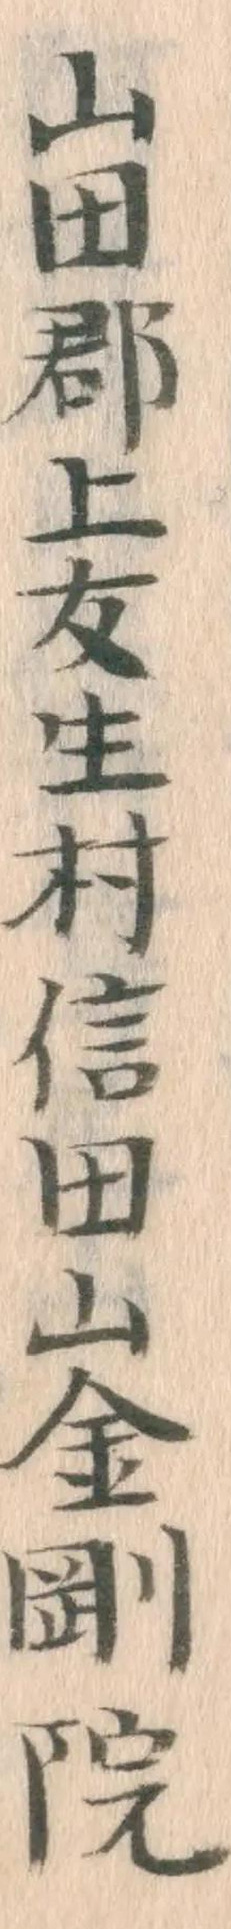山田郡上友生村信田山金剛寺
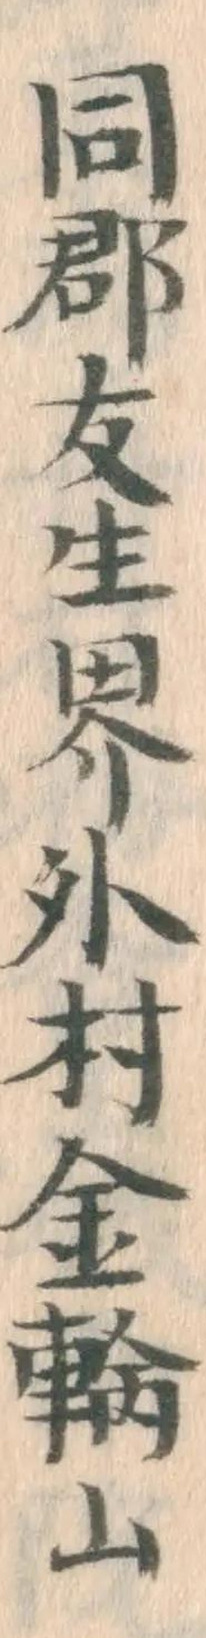同ぐ郡友生界外村金輪山

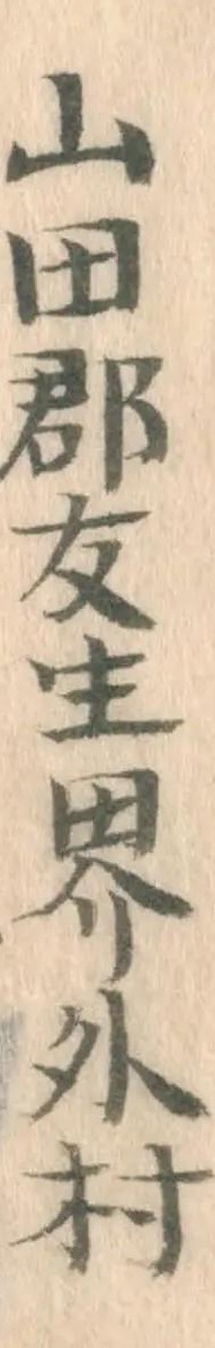山田郡友生界外村
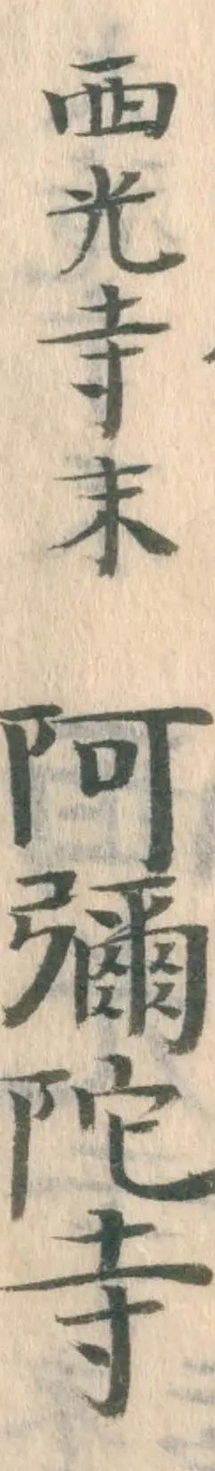西光寺末阿弥陀寺
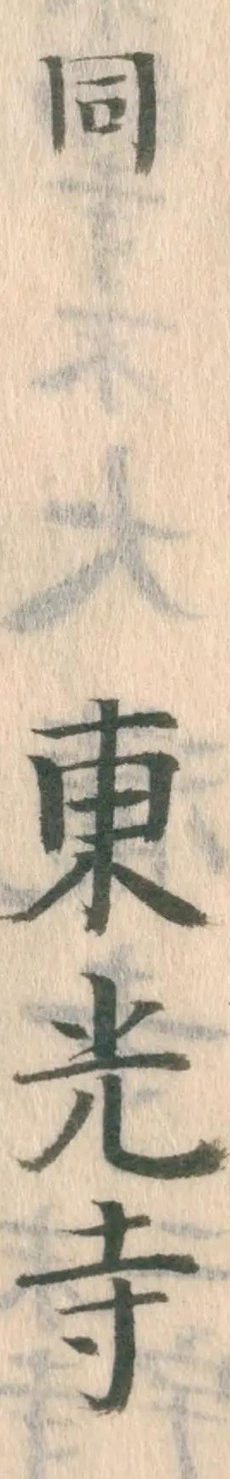同東光寺
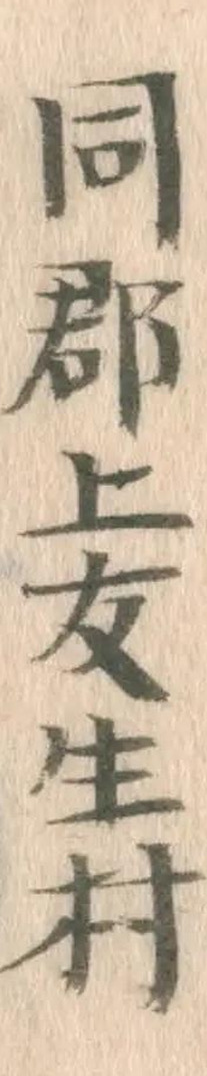同郡上友生村
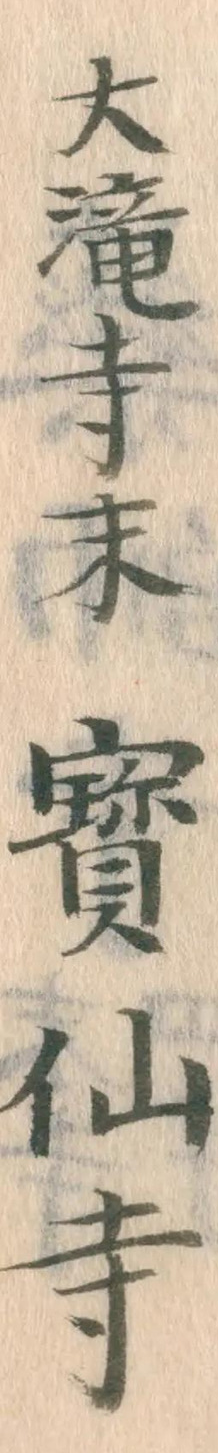大滝寺末寶仙寺
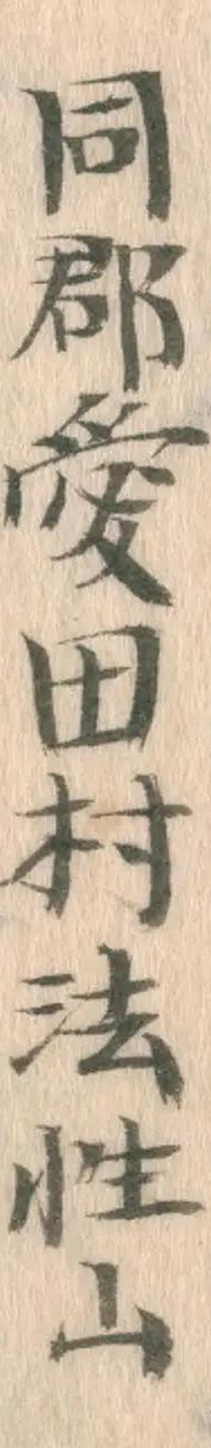同郡愛田村法性山
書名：古義真言宗本末帳 21巻. [4] 第三 伊賀国、伊勢国、志摩国、尾張国、三河国、遠江国、駿河国、伊豆国、甲斐国
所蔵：国立国会図書館 National Diet Library, JAPAN
